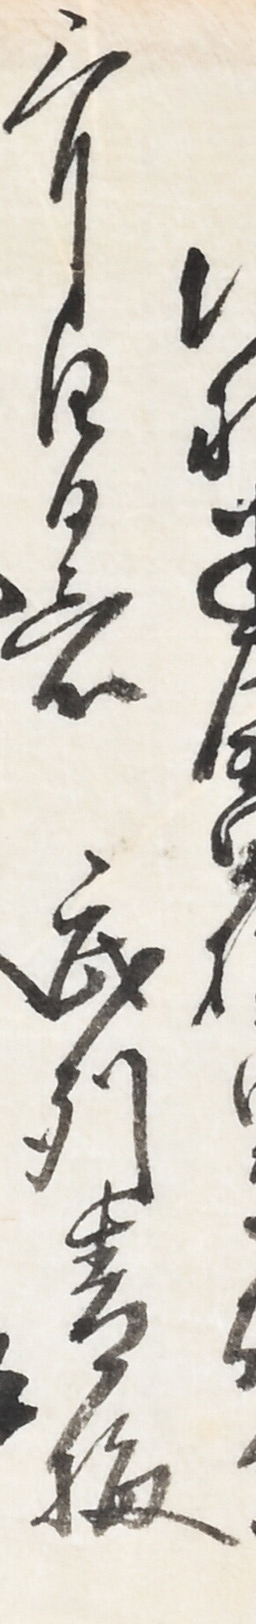三月四日着武州青梅
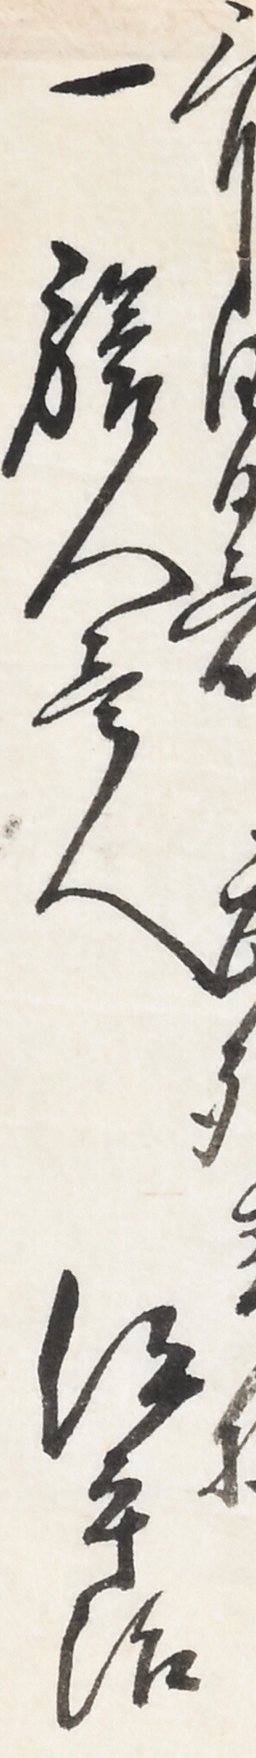一旅人壱人伊平治
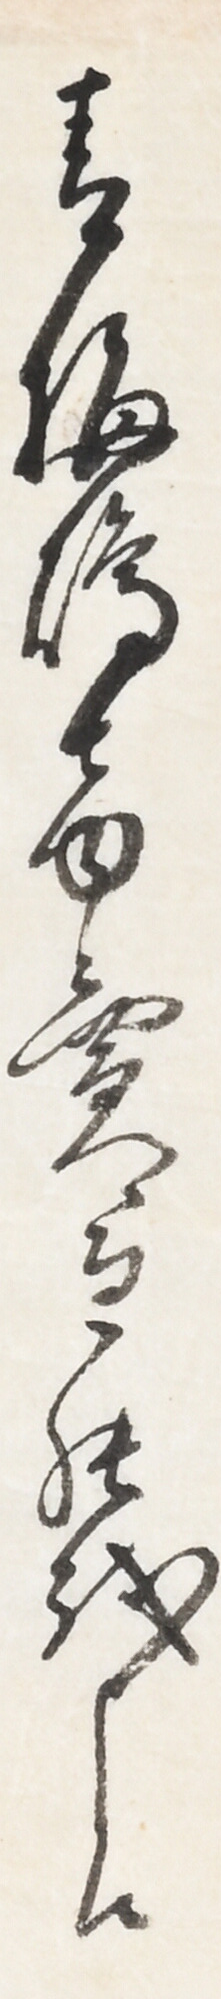青梅嶋商売ニ而罷越申候
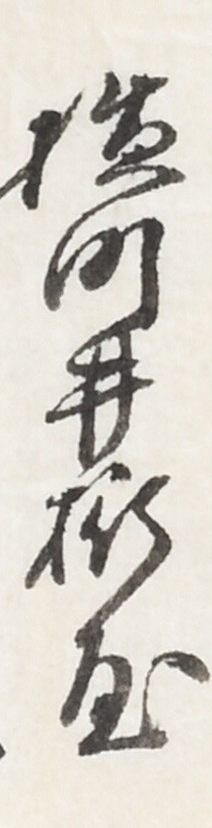横町井桁屋
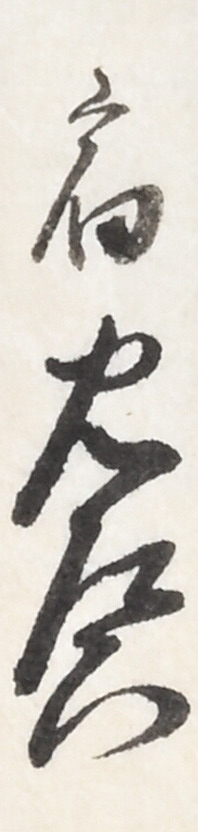宿忠左衛門
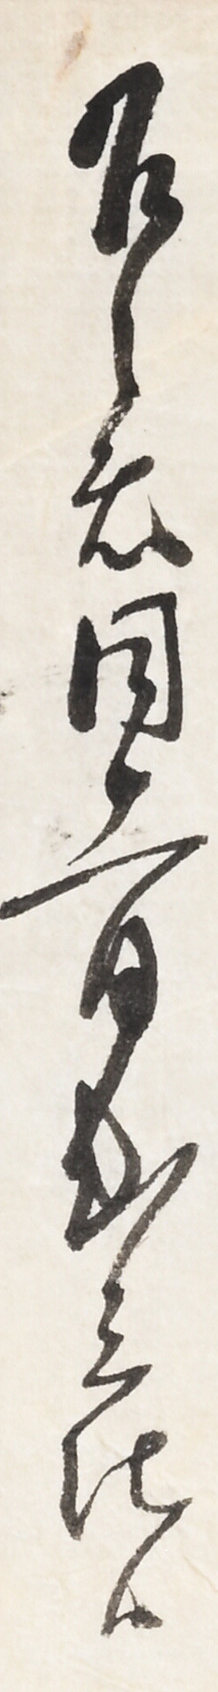右之者同十一日出立仕候
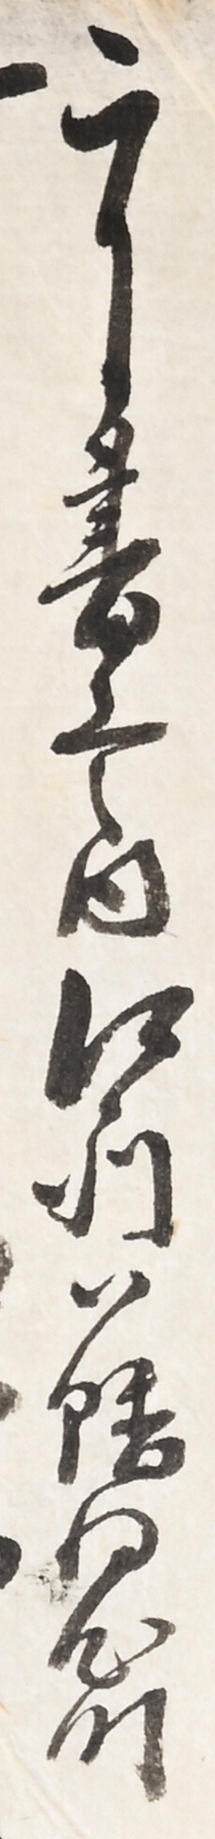二月書上之内江州八幡為心町
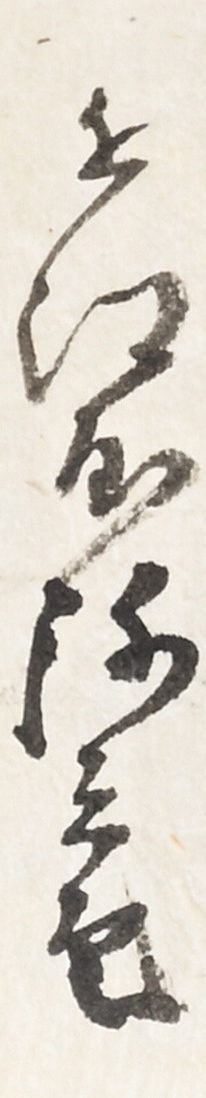一近江屋弥兵衛
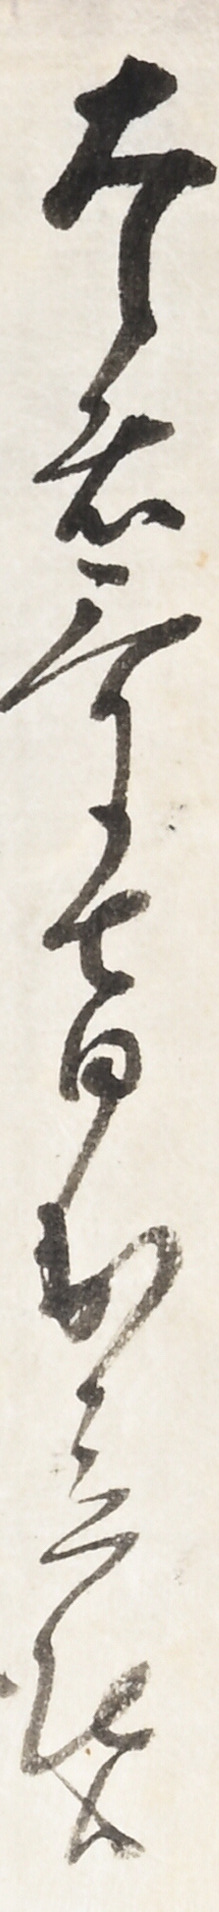右之者三月七日出立仕候
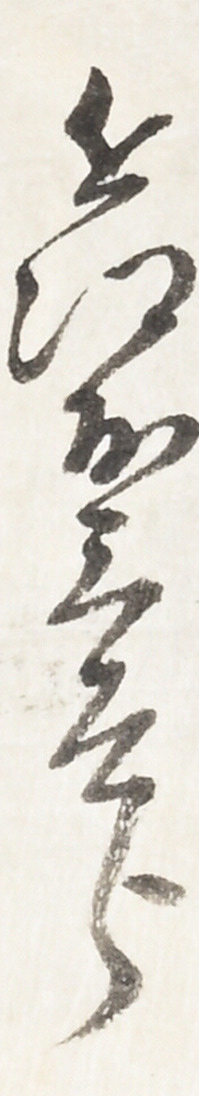一近江屋三太郎
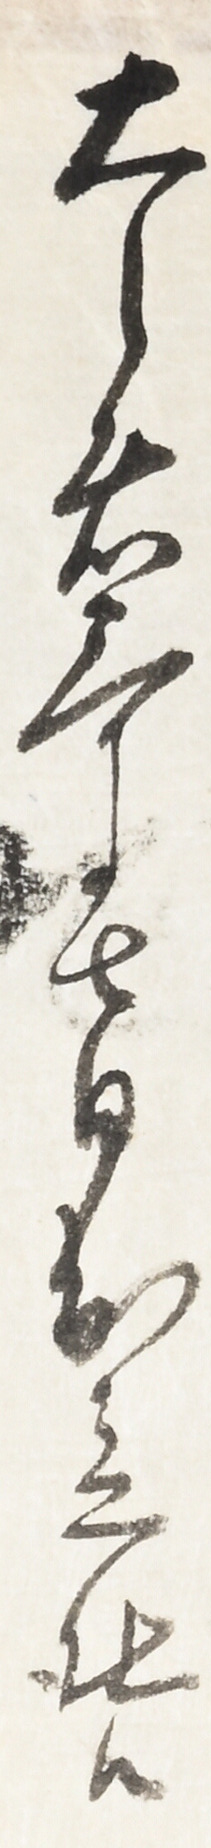右之者三月七日出立仕候
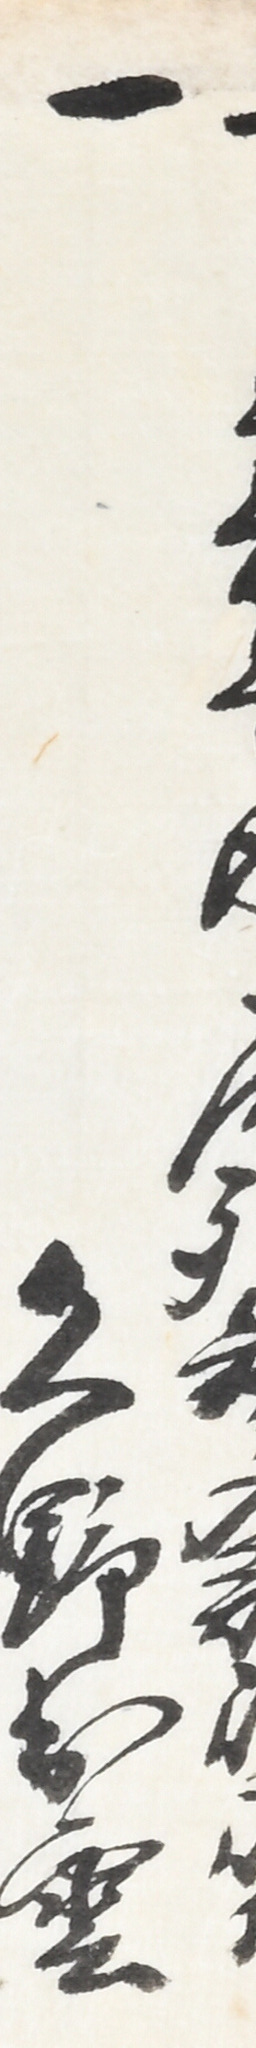一久野出雲
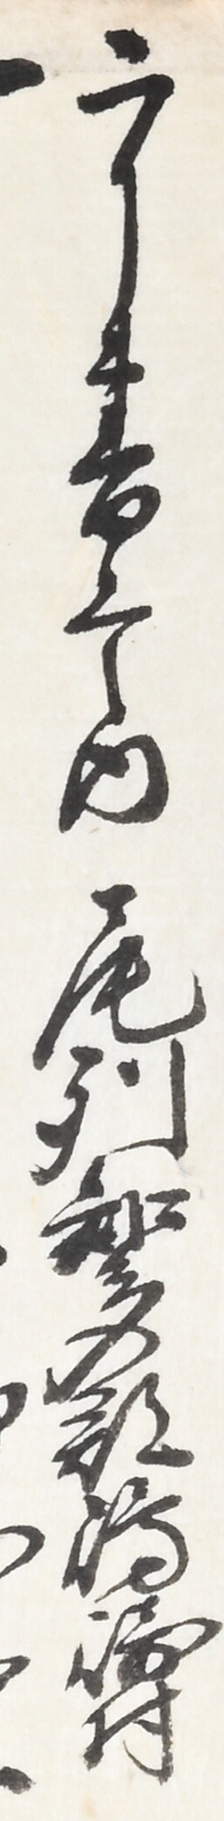二月書上之内尾州知多郡嶋崎村
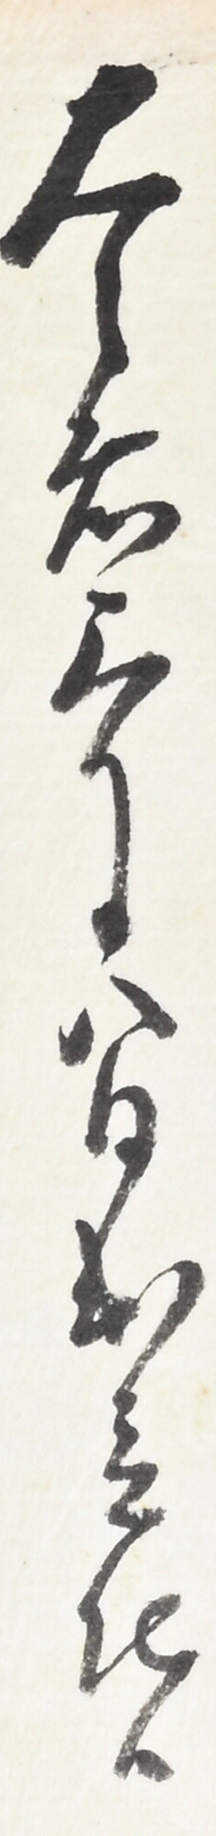右之者三月八日出立仕候
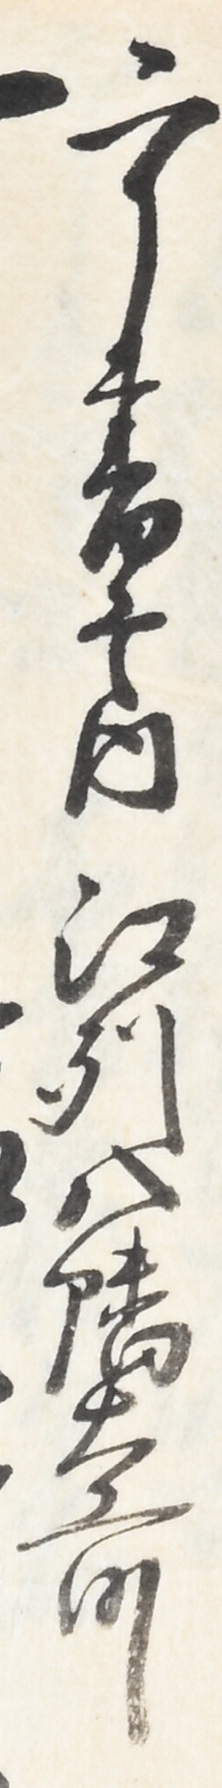二月書上之内江州八幡為心町
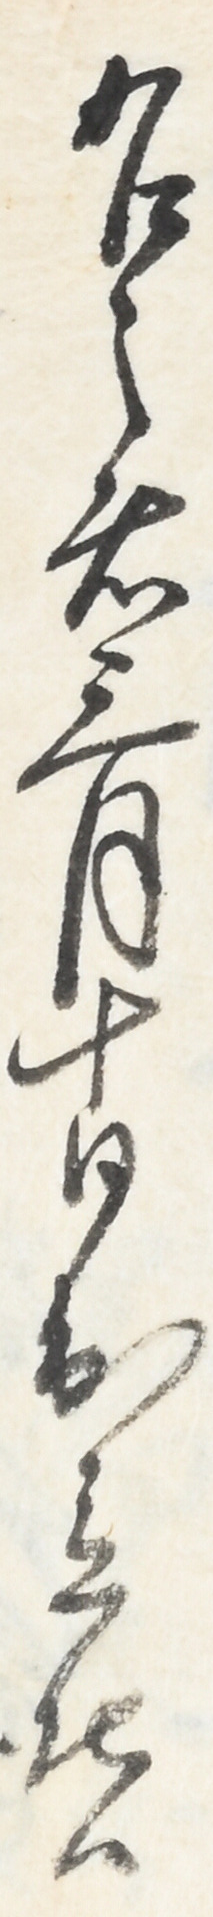右之者三月七日出立仕候
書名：旅人泊控帳
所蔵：伊那市立高遠町図書館・合同会社AMANE
